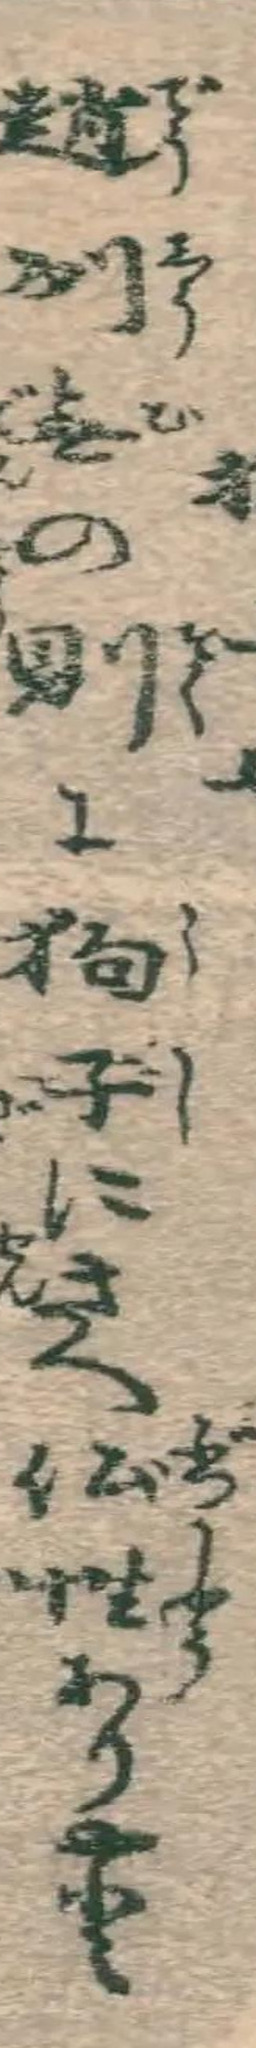趙州無の則に狗子にさへ仏性ありやと
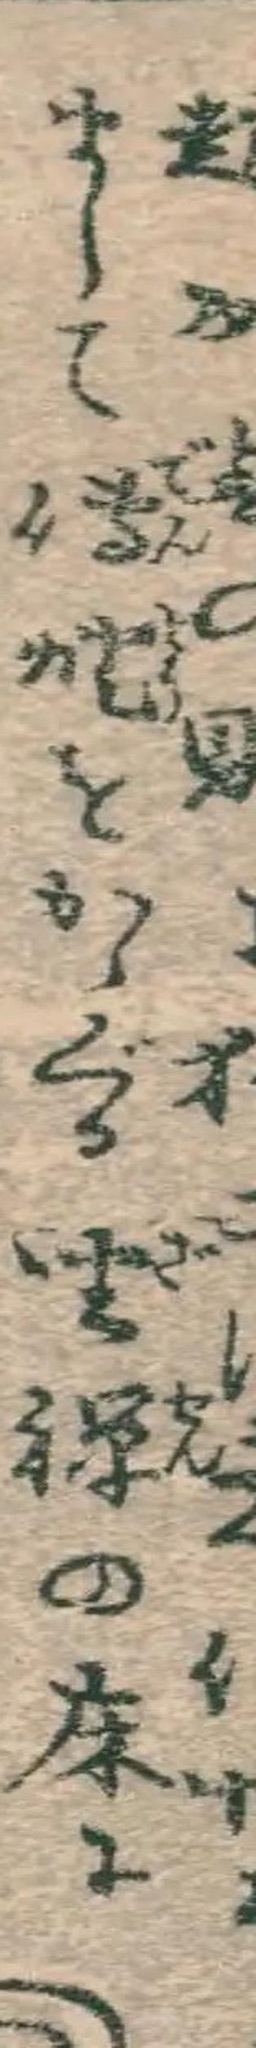まして傳燈をかゝぐる坐禅の床に
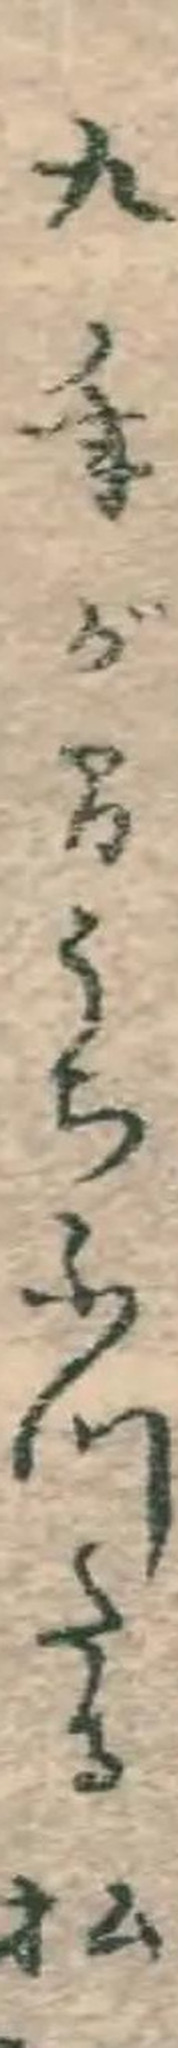九年が間うちふつたる払子
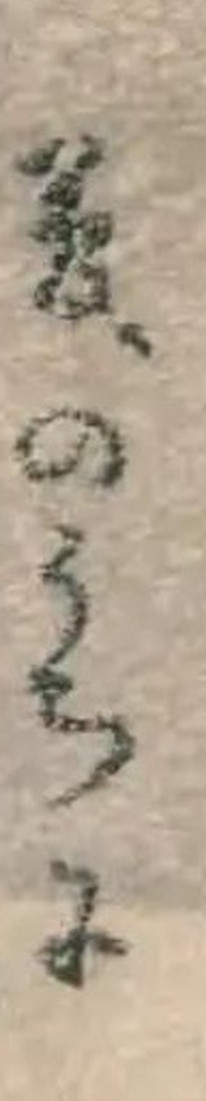夢のうちに
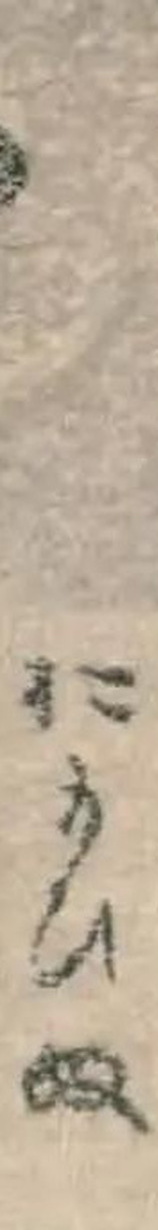おもひぬ
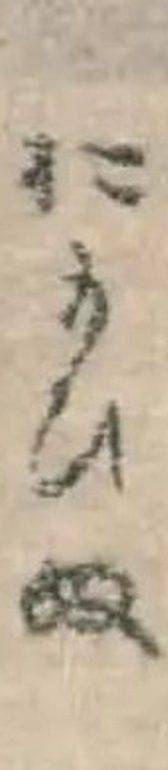おもひぬ

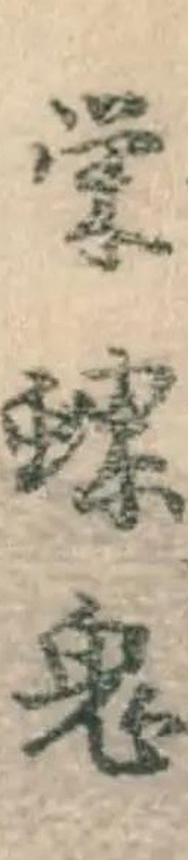栄螺鬼
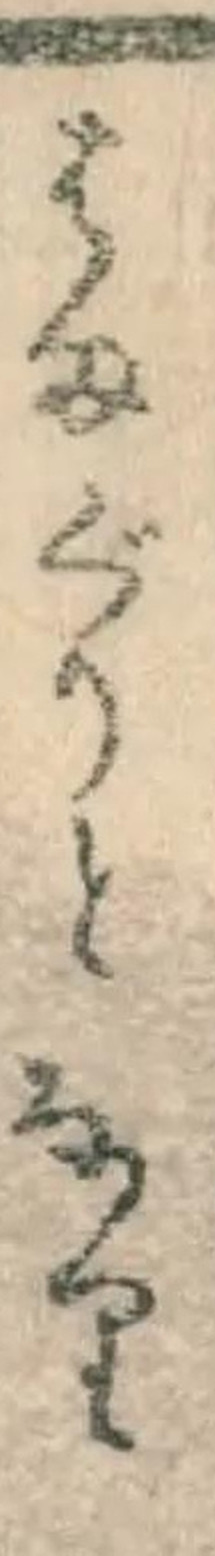はまぐりとなり
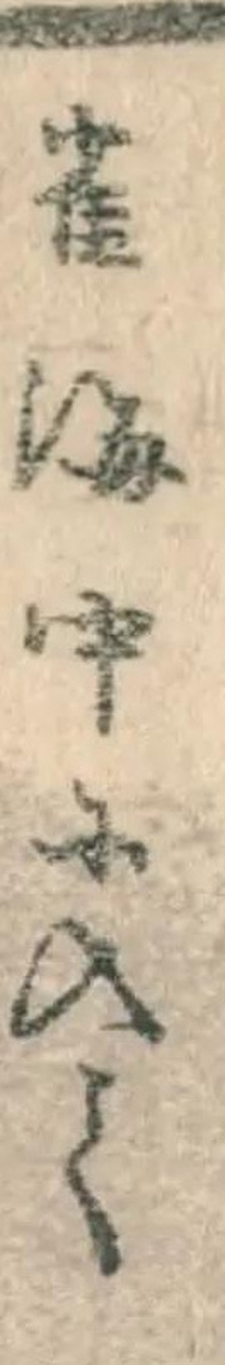雀海中に入て
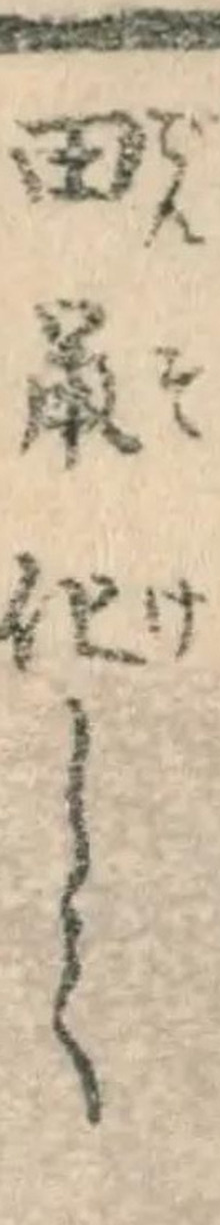田鼠化して
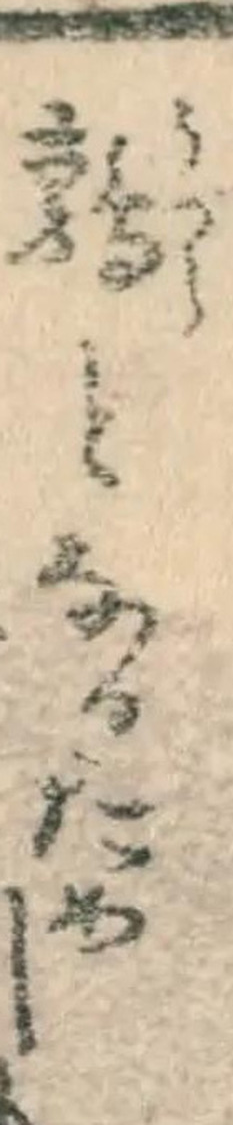鶉となるためしも
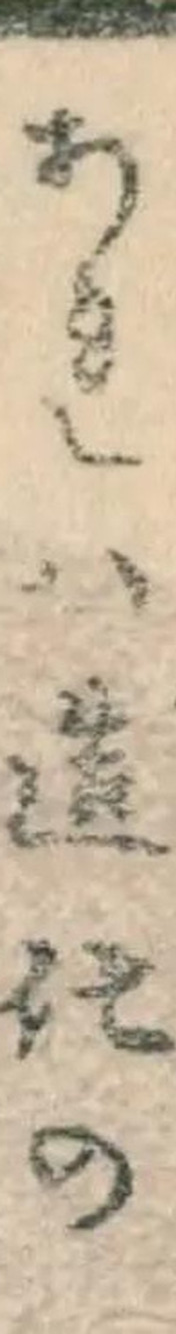あれは造化の
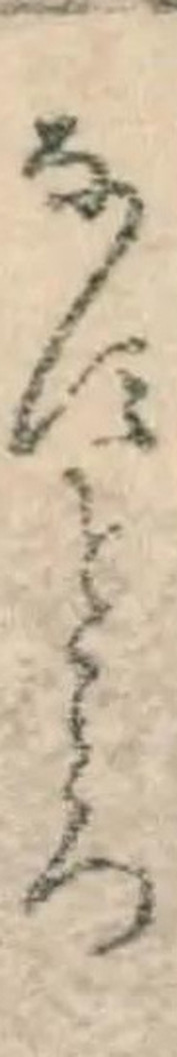なすところ
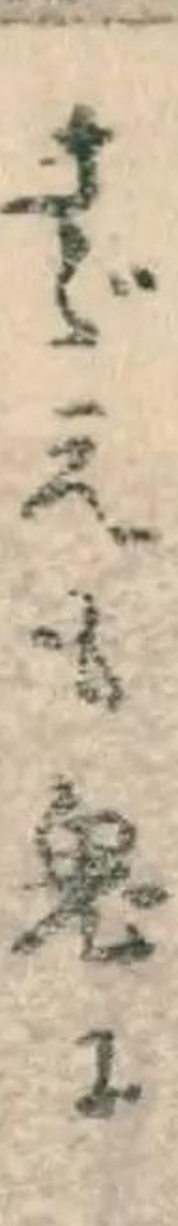さゞえも鬼に
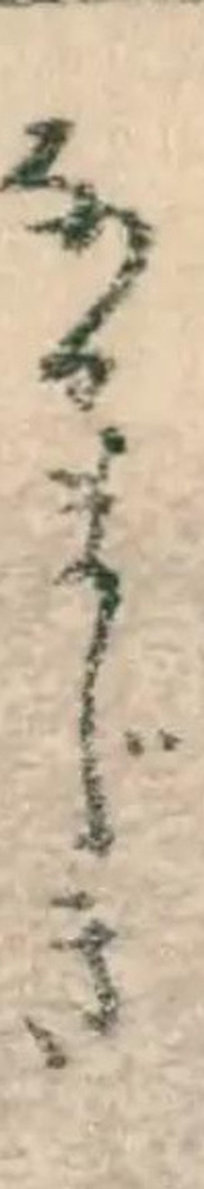なるまじき
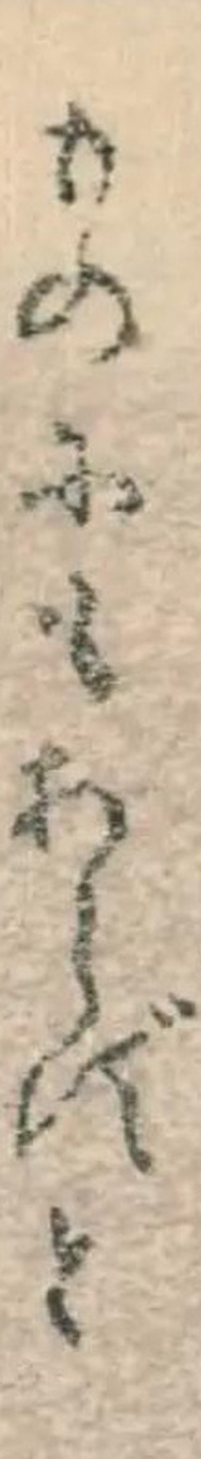ものにもあらずと
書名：百鬼徒然袋 3巻. [1]
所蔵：国立国会図書館 National Diet Library, JAPAN
